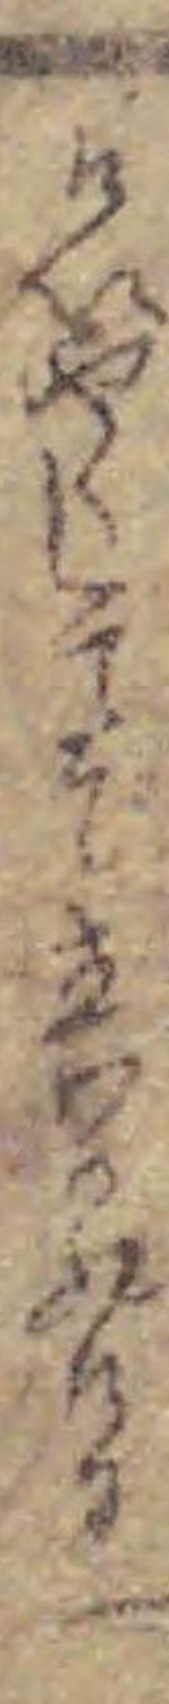けいやくしてぞ立わかれける

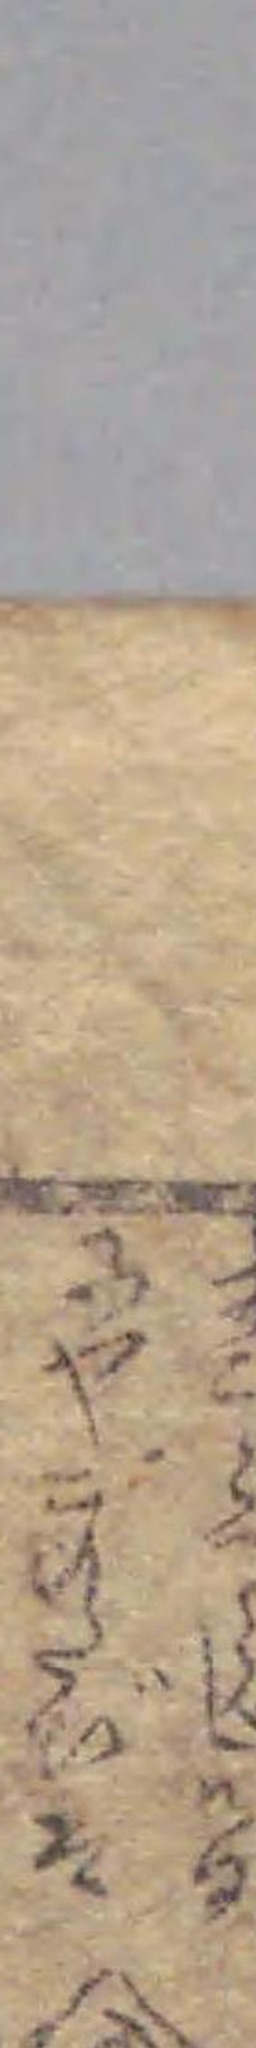にやこのたびは
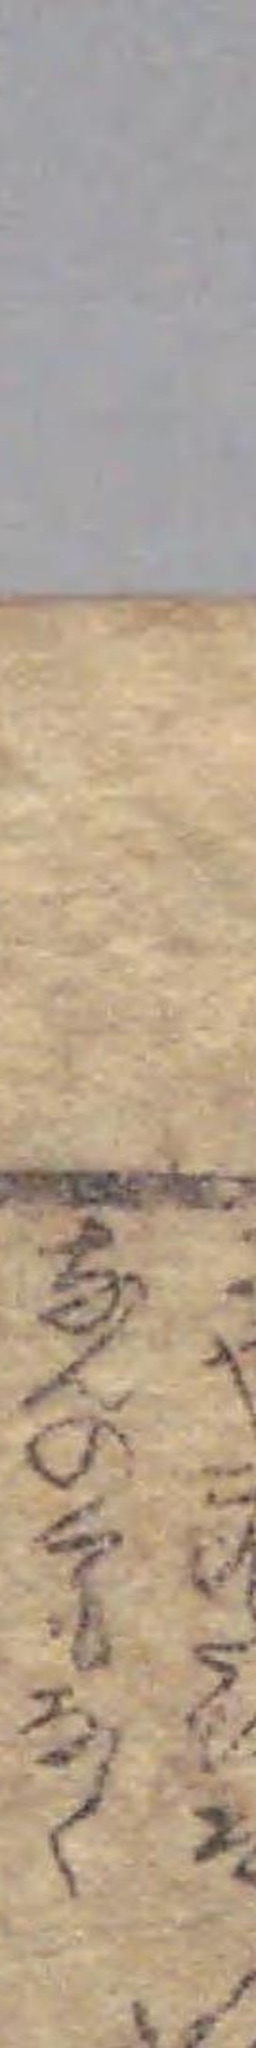なんのくもなく
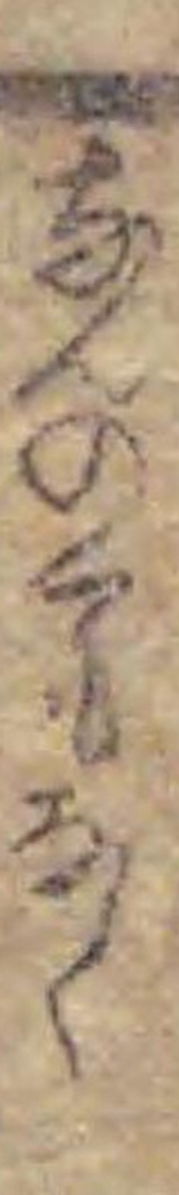なんのくもなく
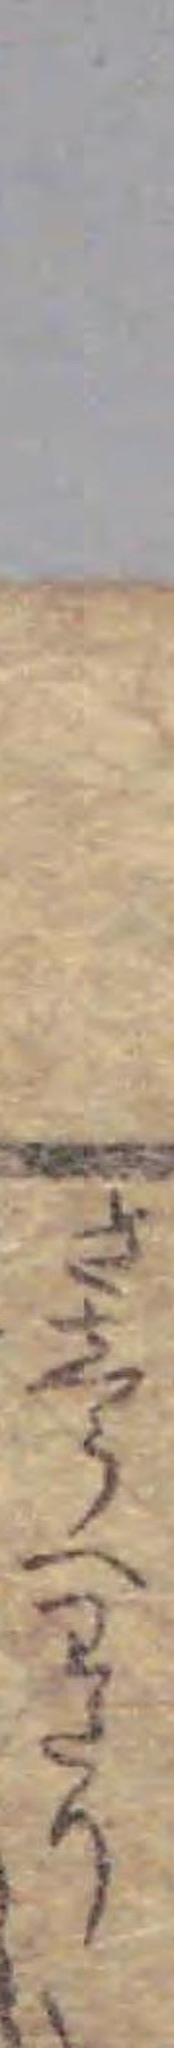さしうへわたり
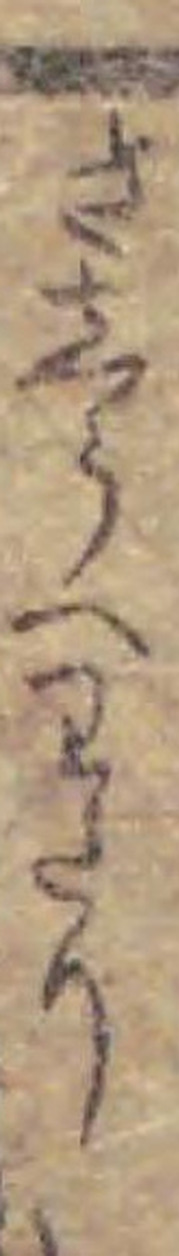さしうへわたり
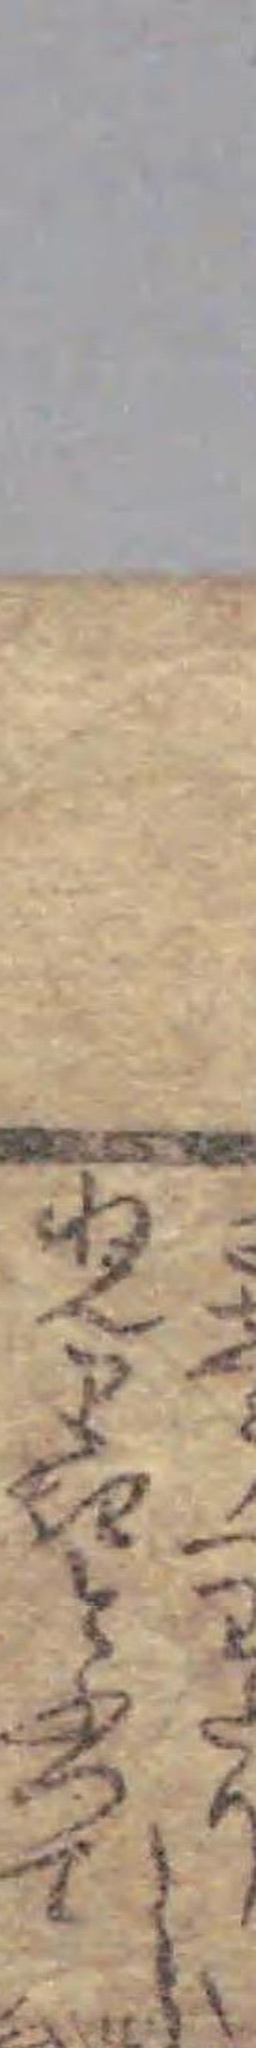ねんりきとふつて
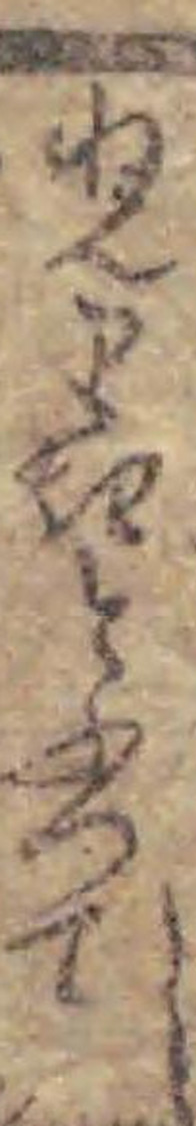ねんりきとふつて
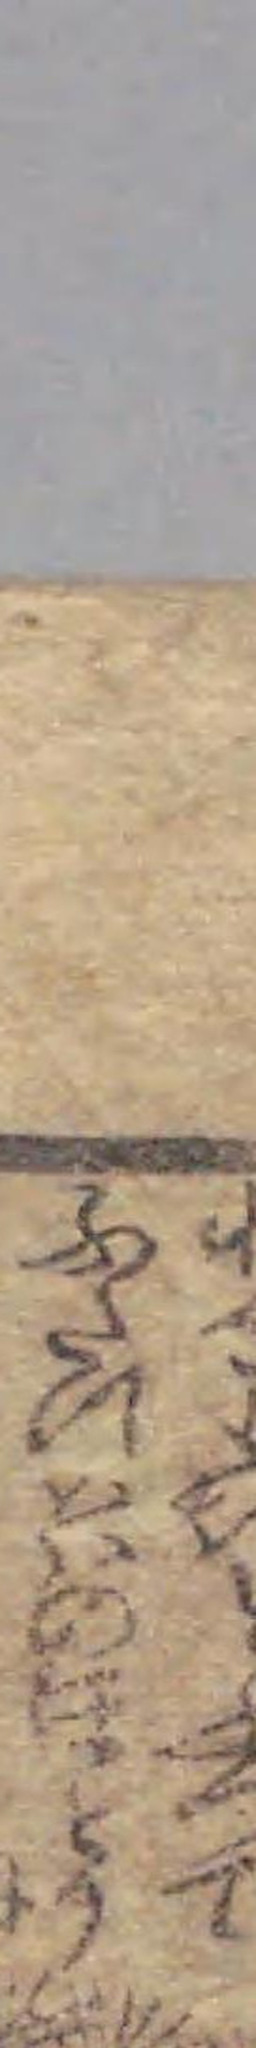ふたついはのほとり
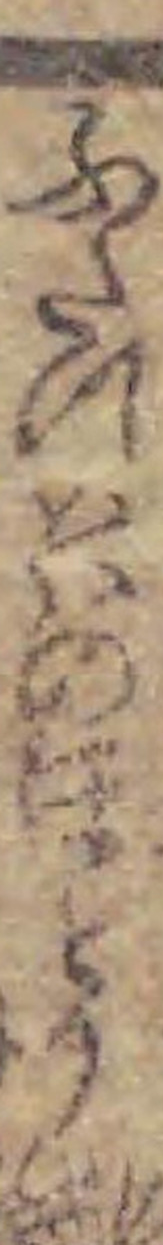ふたついはのほとり
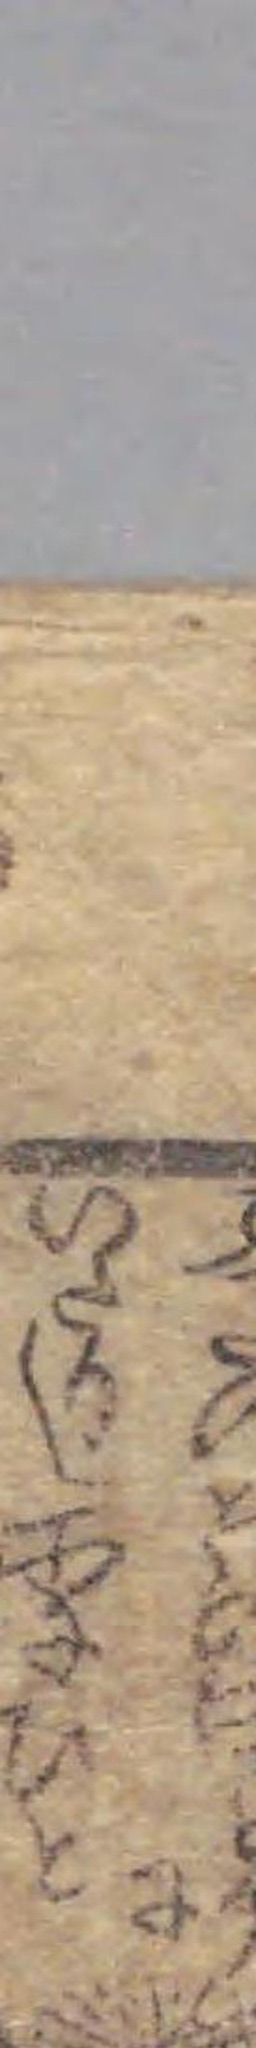いたりし所にひと
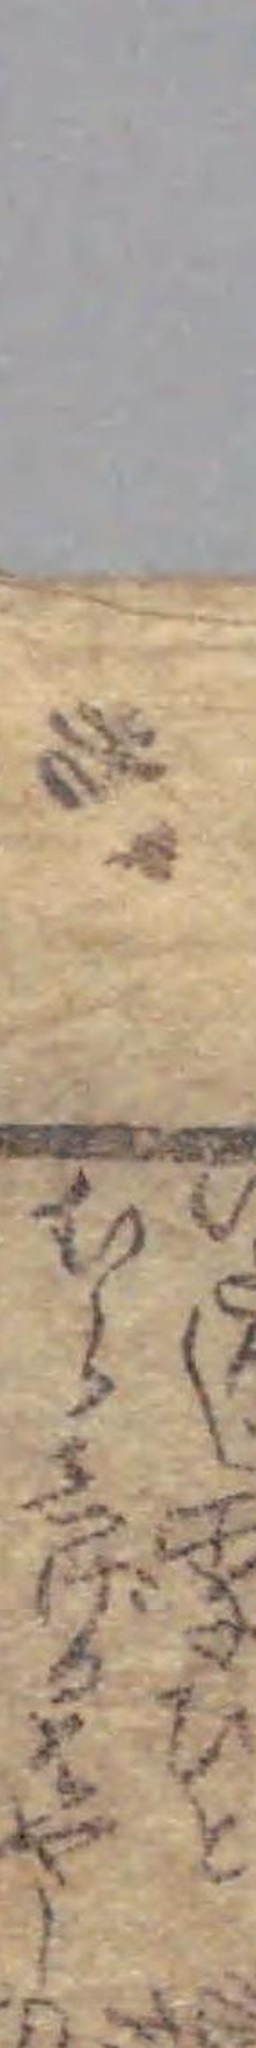むらしげるはやしの
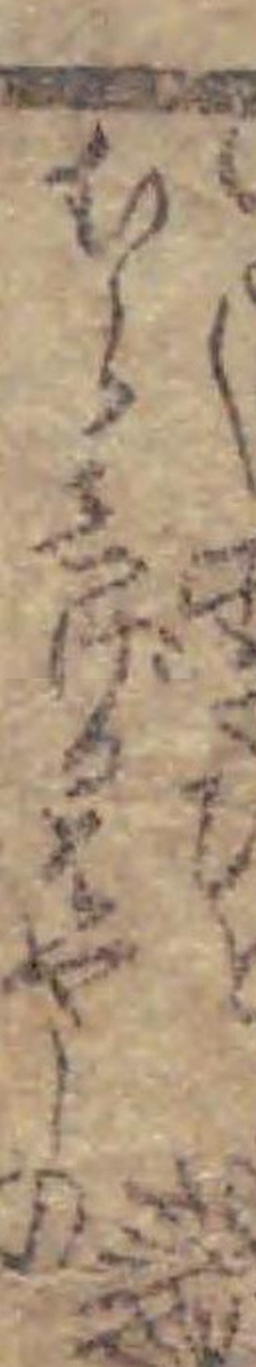むらしげるはやしの
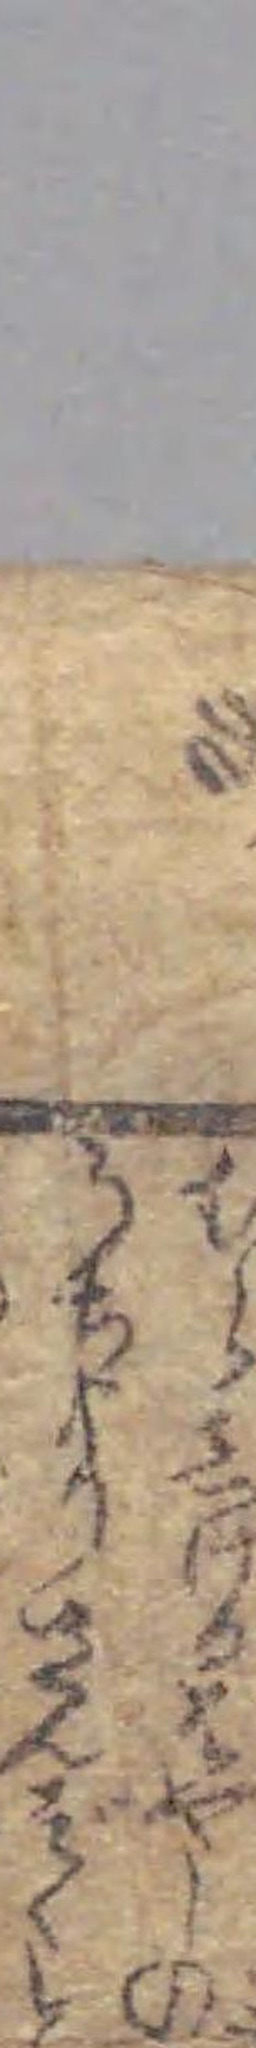うちよりさんぞくと
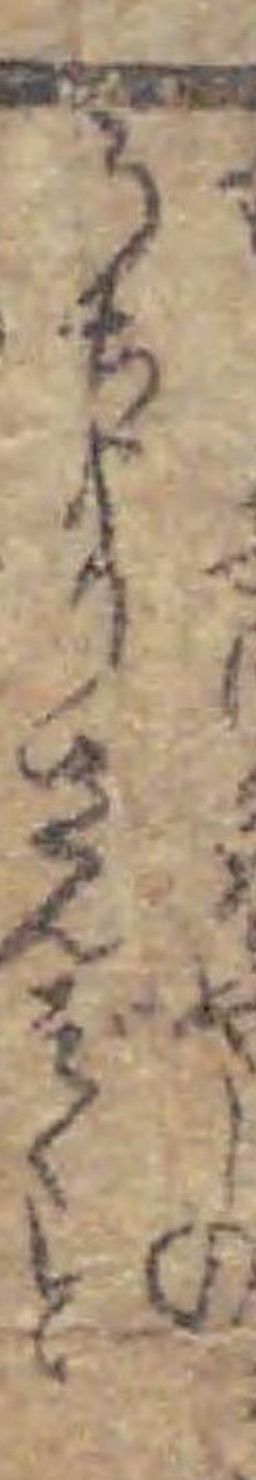うちよりさんぞくと
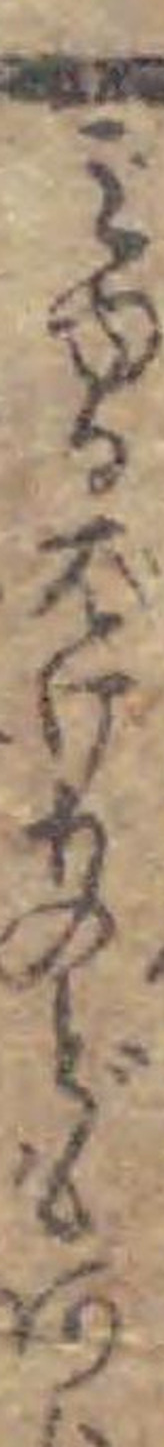みゆるばけものどもあら
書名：化物世界夜半嵐 : 3巻
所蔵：国立国会図書館 National Diet Library, JAPAN
